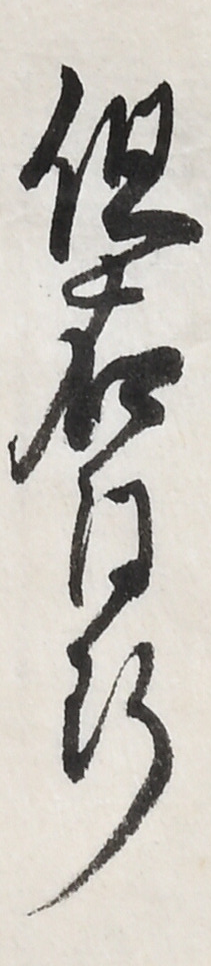但右同断
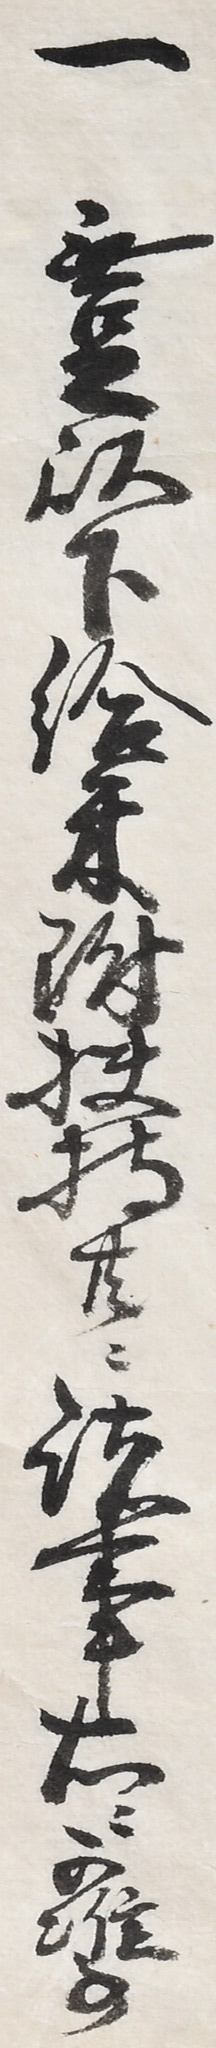一無足以下給米附扶持共ニ諸事右ニ可准事
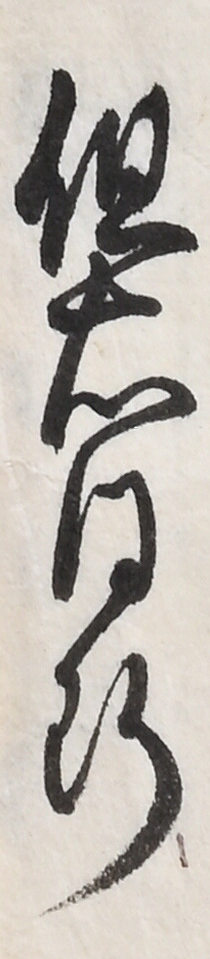但右同断
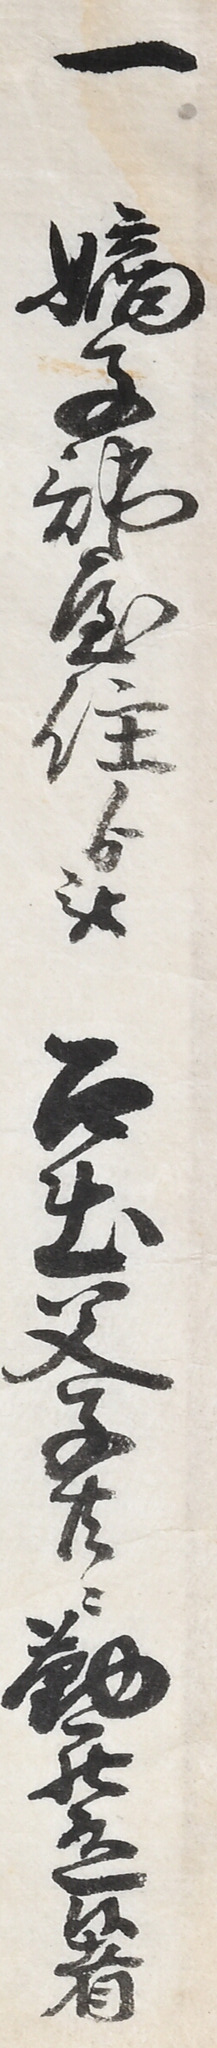一嫡子部屋住ゟ召出父子共勤罷有候は
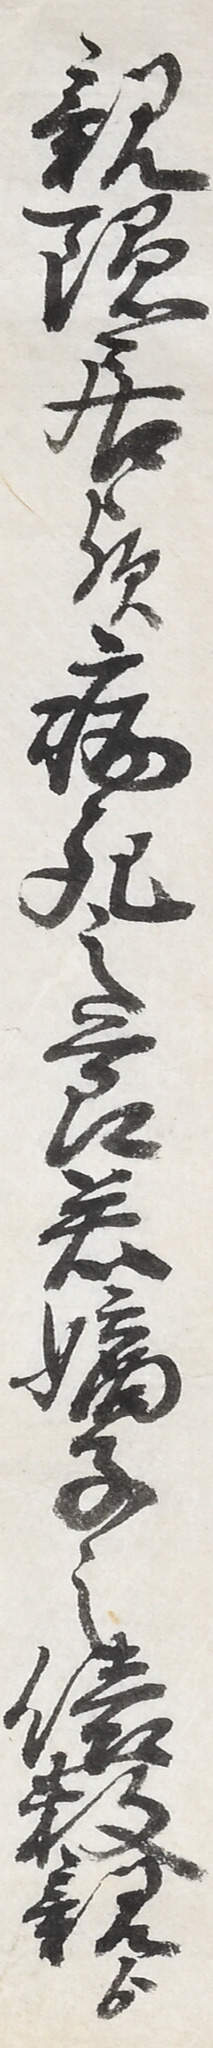親隠居欤病死之節若嫡子之俵数親ゟ
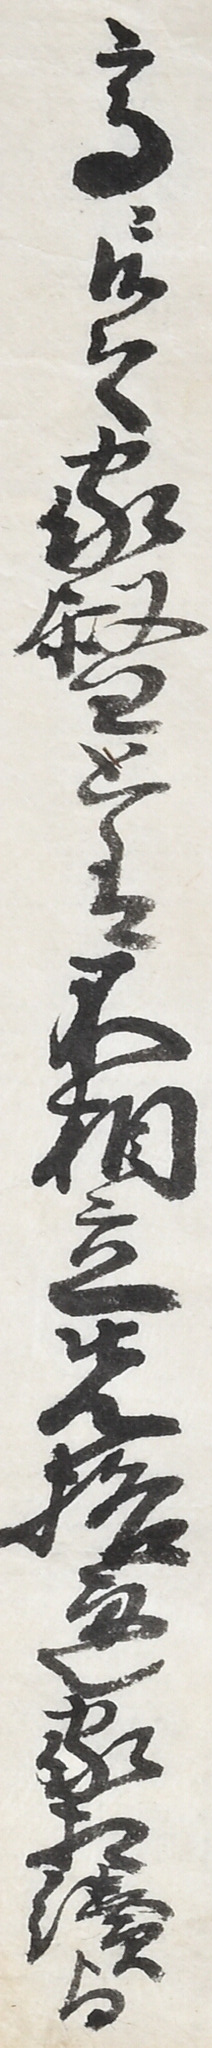高ニ候ハヽ家督と有不相立先格通家相続と
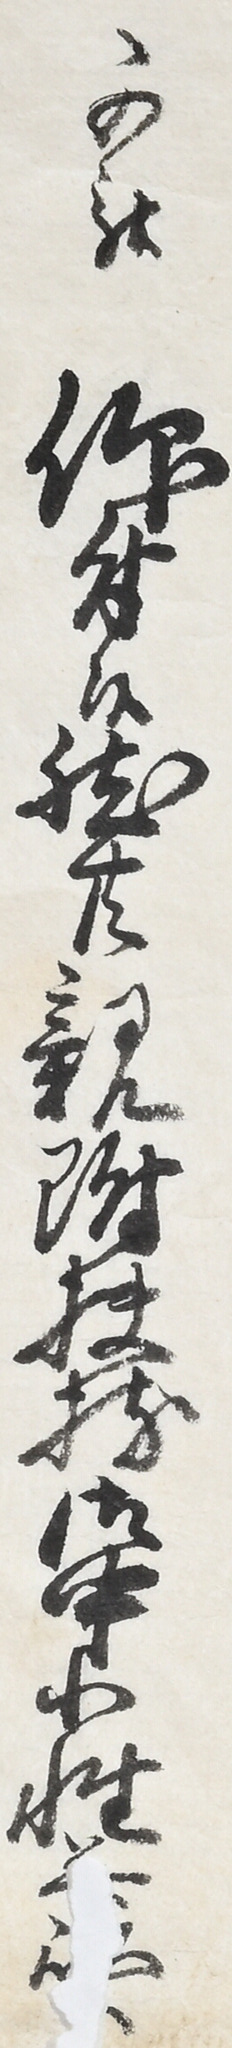可被仰付候然共親附扶持御中小姓
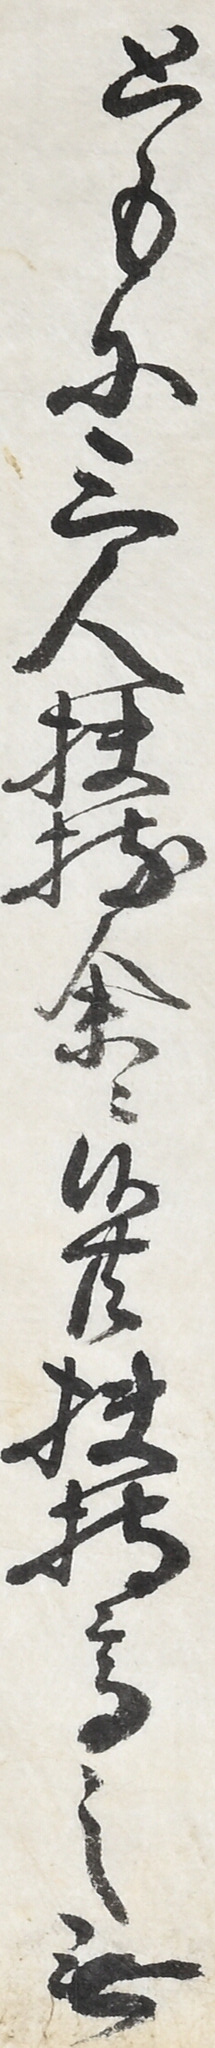ともに三人扶持余ニ候共扶持高之無
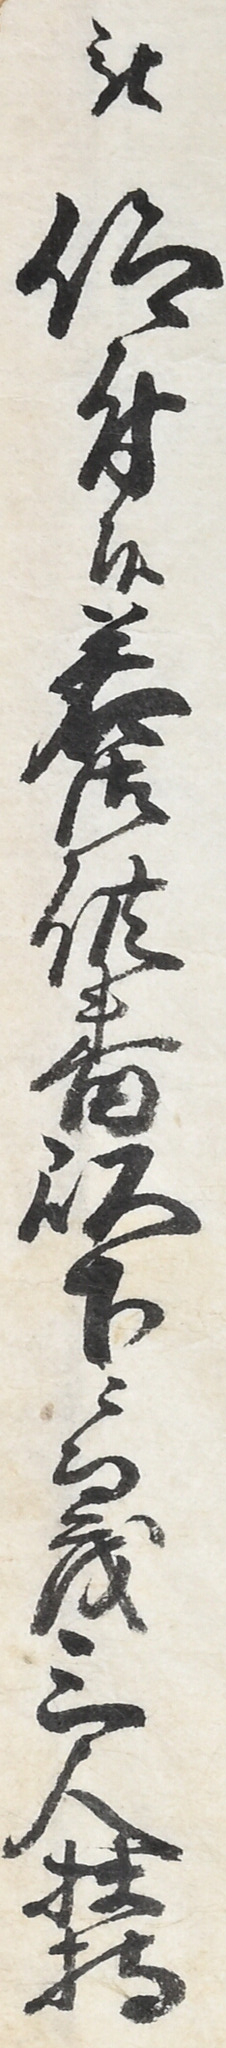被仰付候若御供番以下ニ而も三人扶持

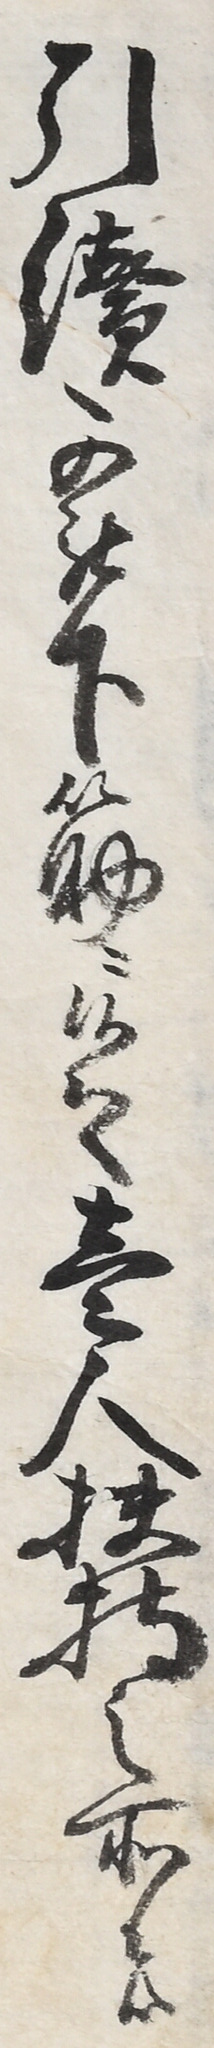引続可被下筋ニ候ハヽ壱人扶持之所は
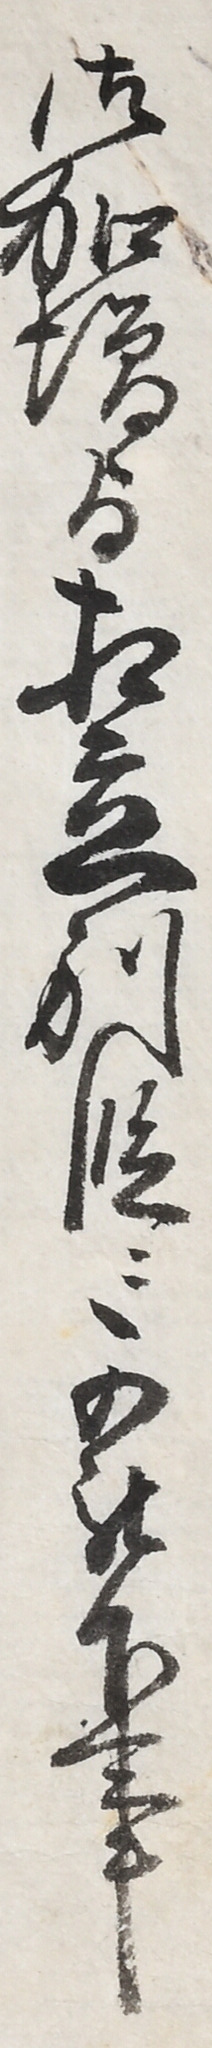御加増と相立別段ニ可被下事
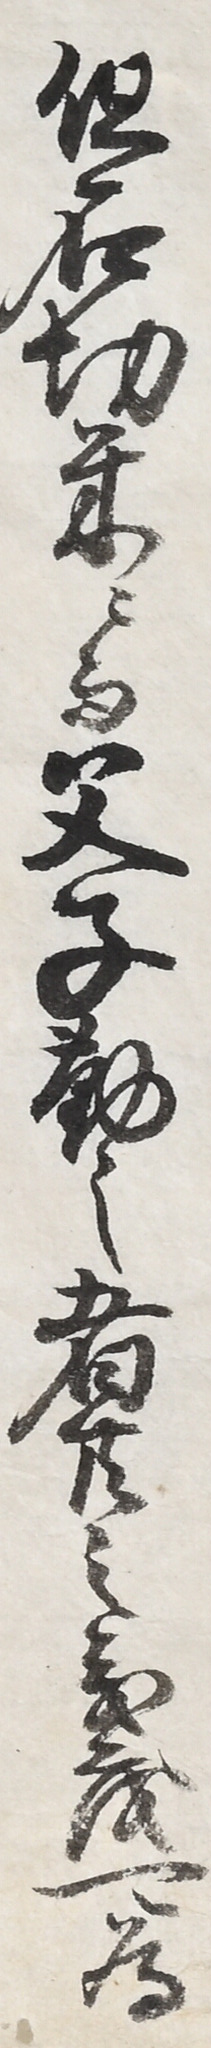但石切米ニ而父子勤之者共之義も可為
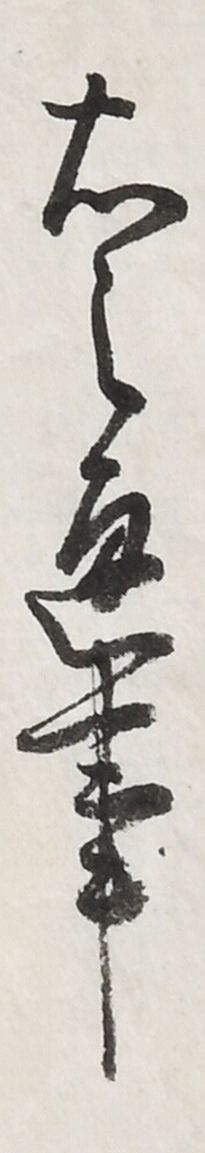右之通事
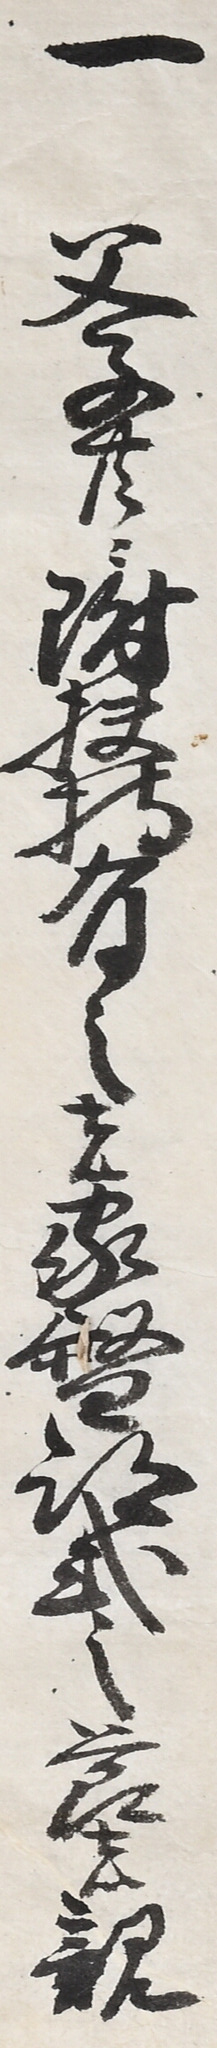一父子共附扶持有之は家督跡式之節は親
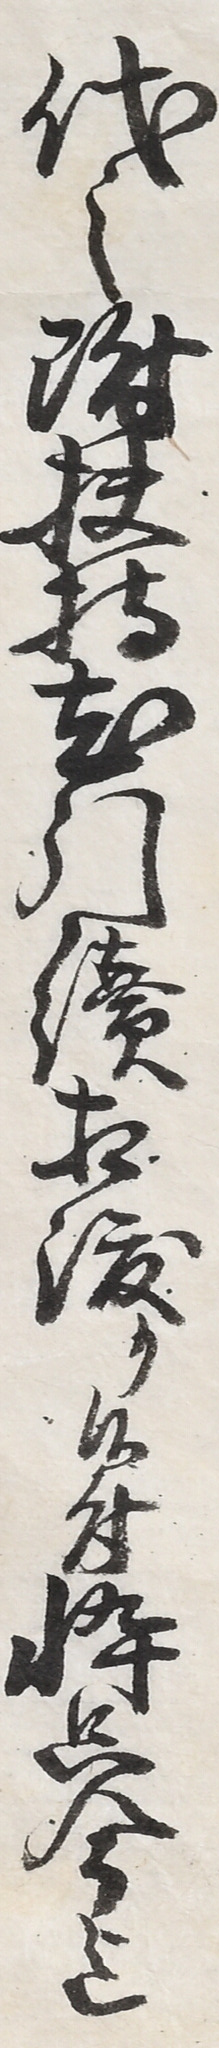代之附扶持尤引続相渡り候付忰只今迄
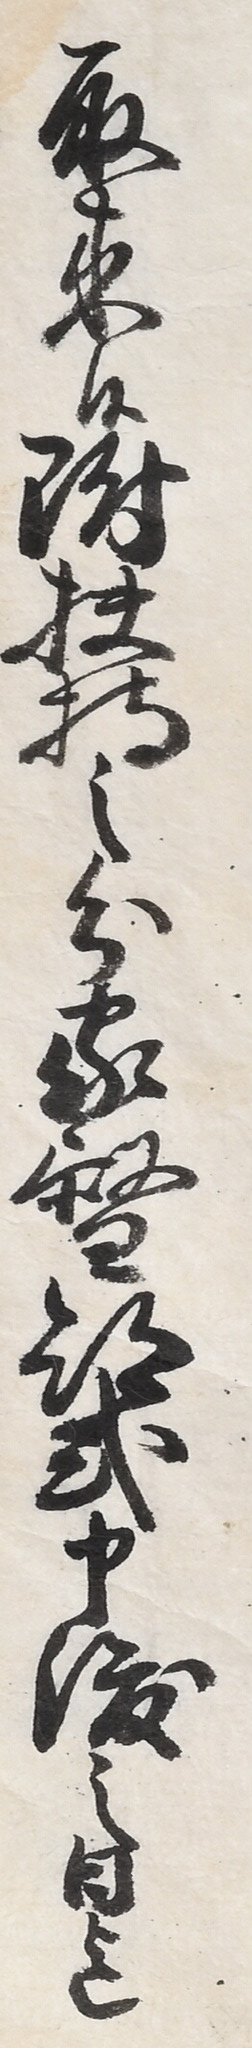取来候附扶持之分家督跡式申渡之月迄
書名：御給分渡方之定
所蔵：伊那市立高遠町図書館・合同会社AMANE
